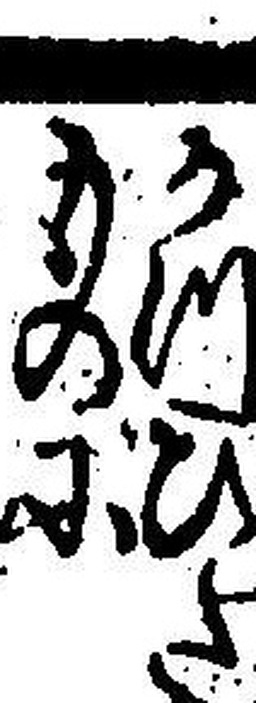ものに
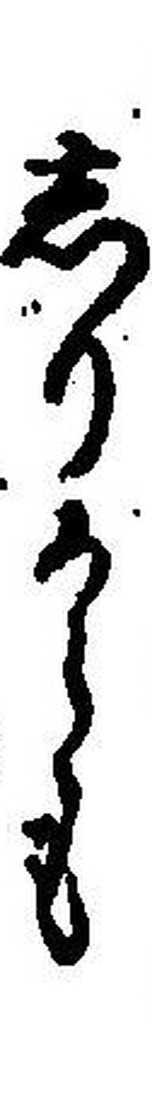しりからも
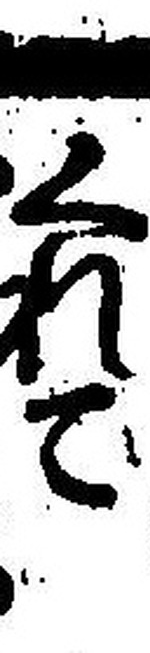くれて
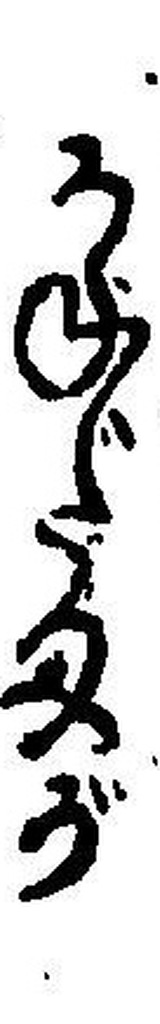かねだまが
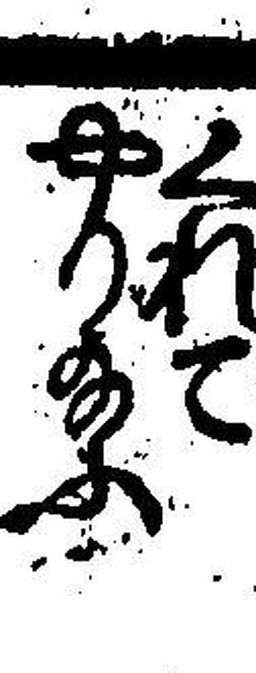やり給ふ
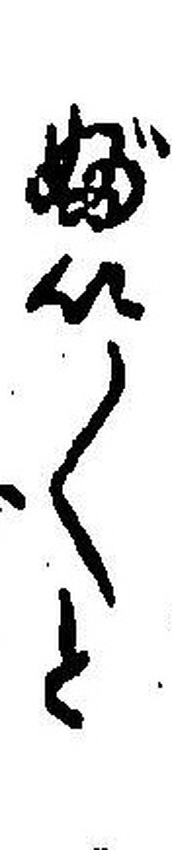ぶい〳〵と
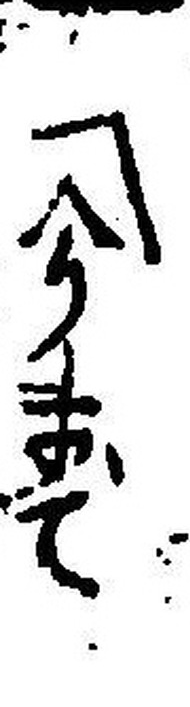〽今まで
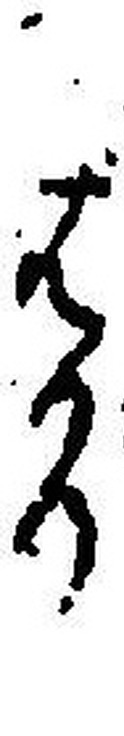ばかり
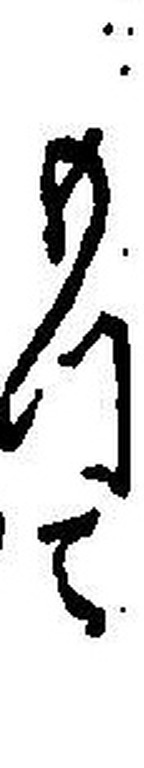もつて
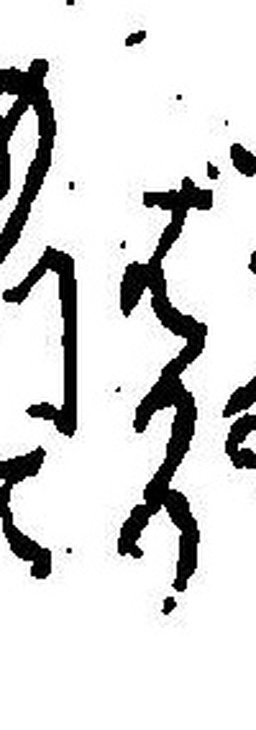もつて
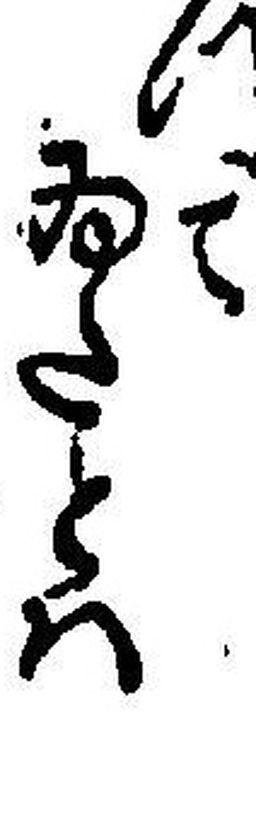ゐたとは
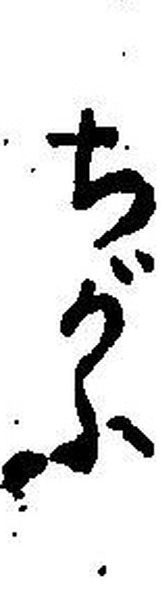ちがふ
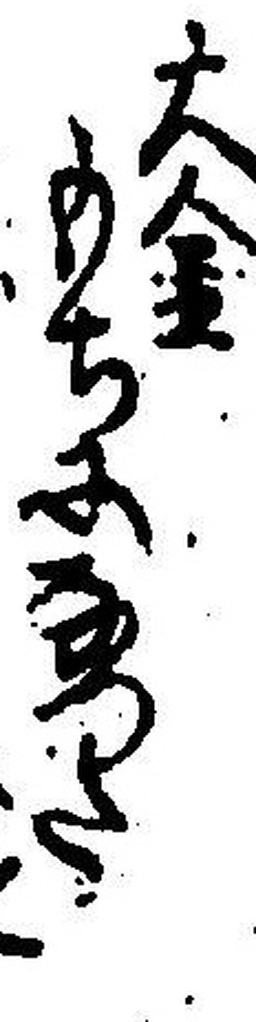もちになつた
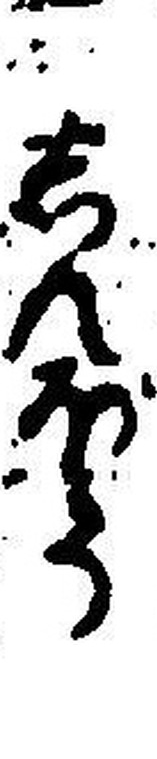しんぼう

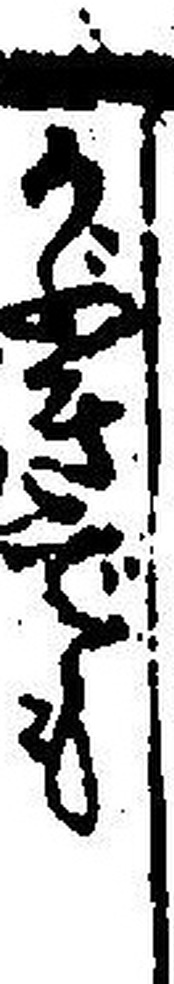かぶきでも
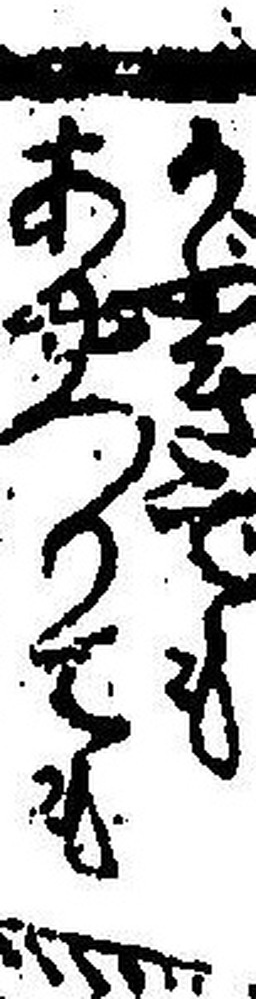あやつりても
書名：徳若水縁起金性 / 樹下石上作
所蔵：東京大学総合図書館 General Library in the University of Tokyo, JAPAN
